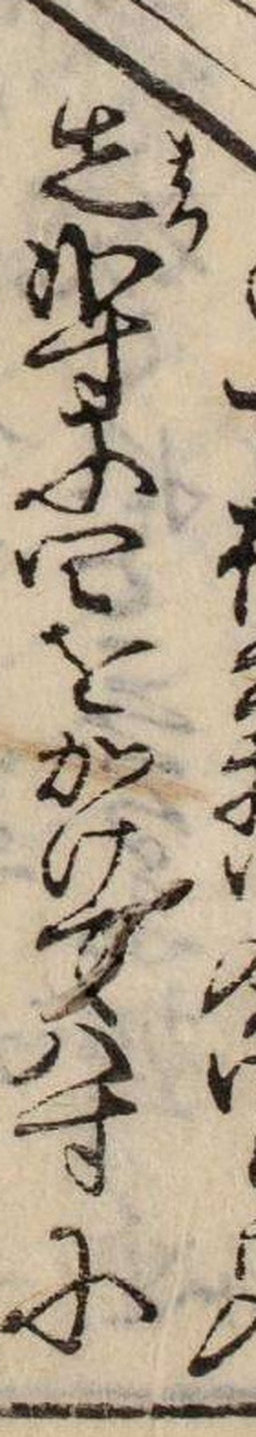先弐寸に四をかけて八寸に
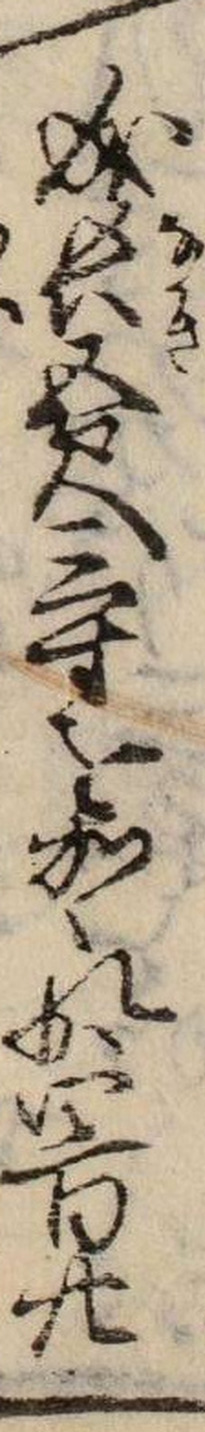成長五尺三寸をかくれは四百廿
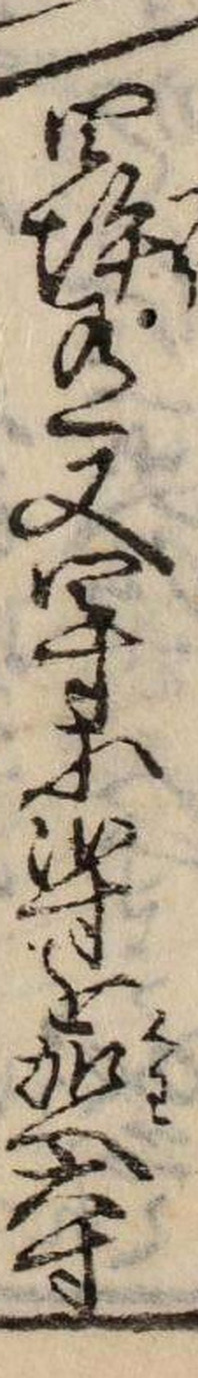四坪有又四寸に弐寸を加へ六寸
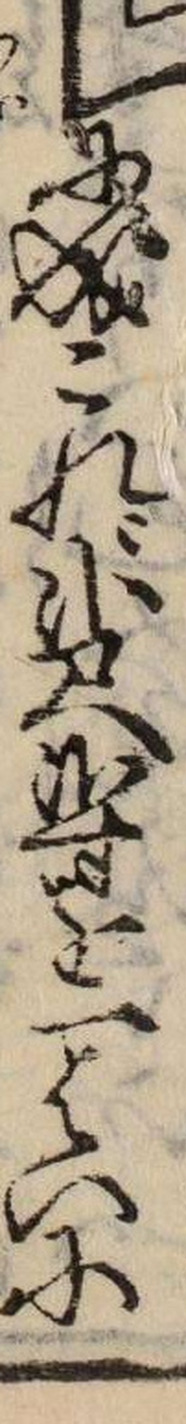に成これに弐尺弐寸を一はいに
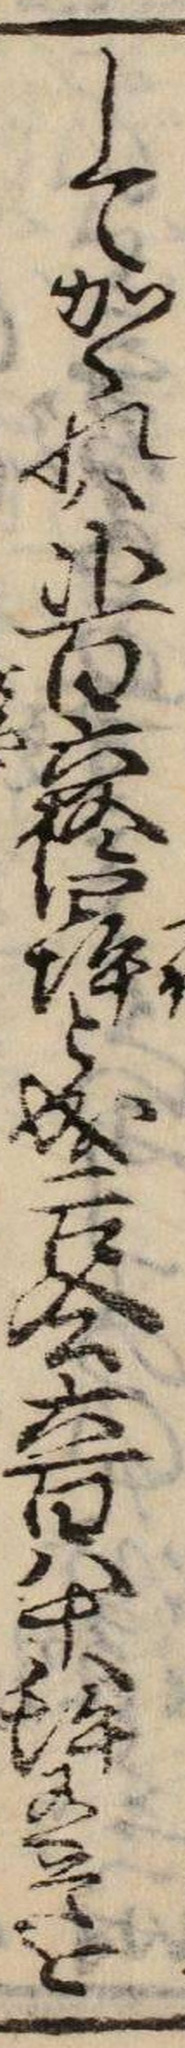してかくれは弐百六拾四坪と成二口合六百八十八坪有是を
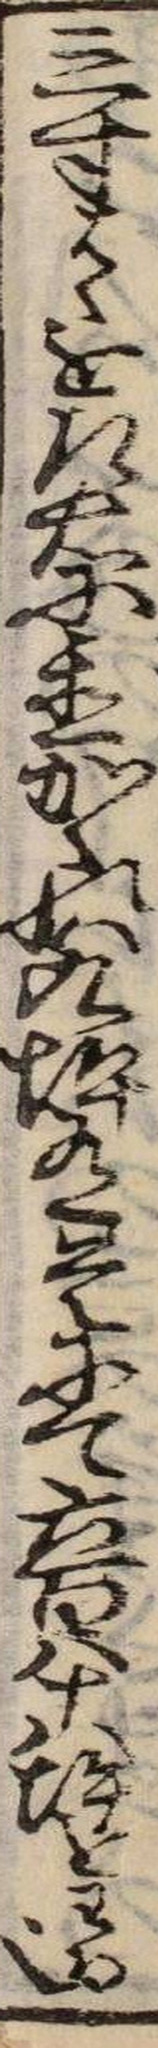三寸はくを左右に置かくれは九坪有是にて六百八十八坪をわる也
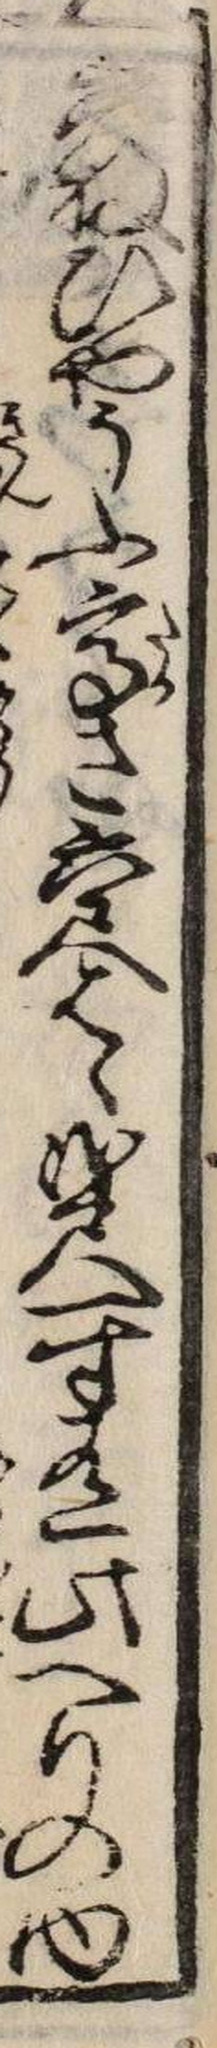△六枚ひやうふ高さ六尺はゝ弐尺一寸有此へりの内
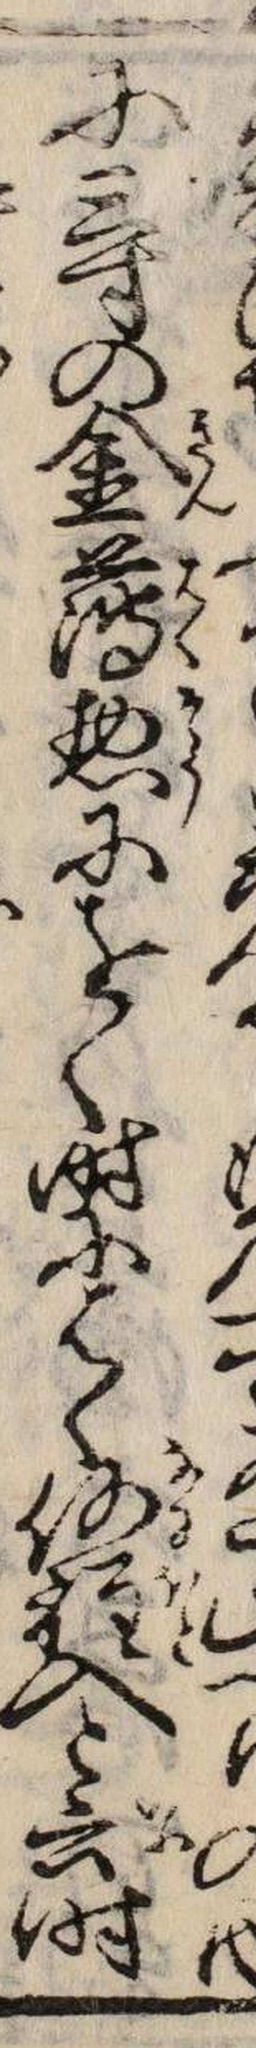に三寸の金薄惣にをく時にはく何程入と云時
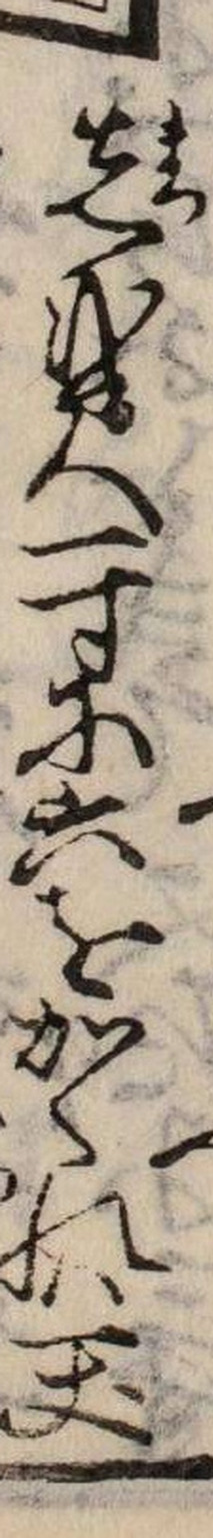先弐尺一寸に六をかくれは一丈
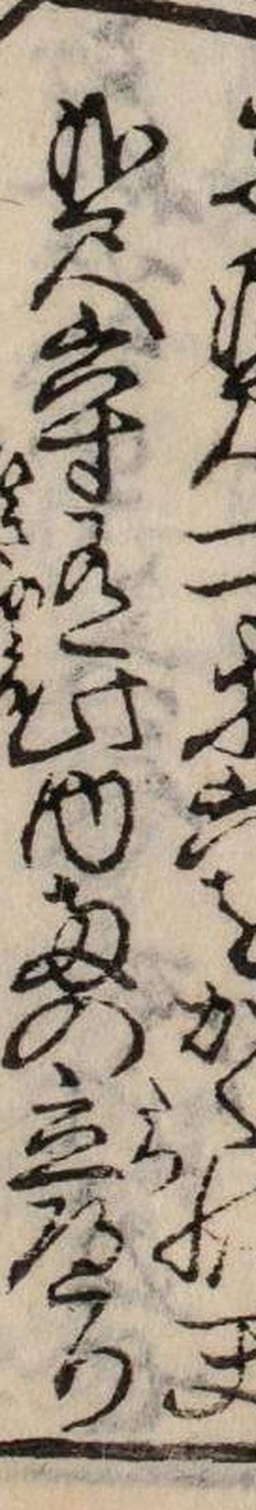弐尺六寸有此内両の立へり
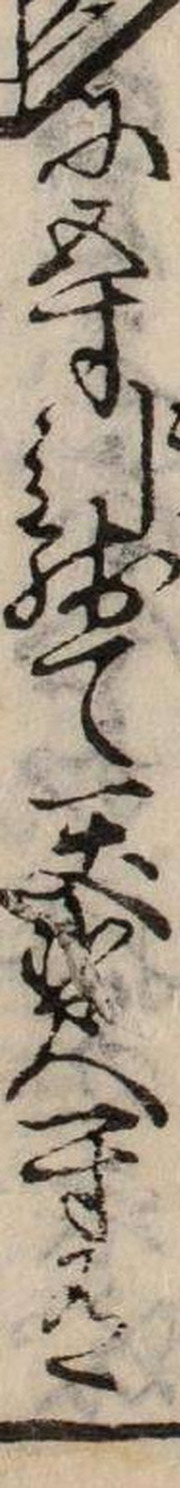に五寸引残て一丈弐尺一寸有
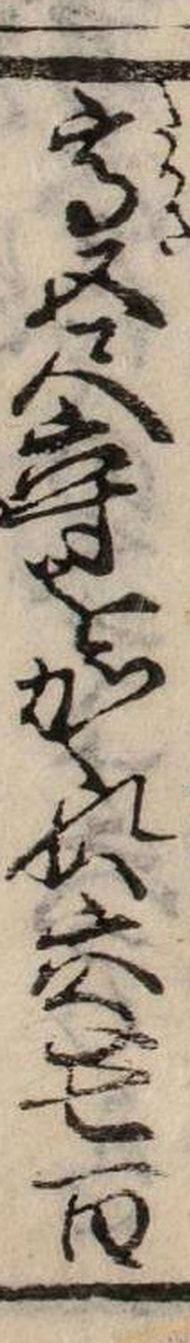高五尺六寸をかくれは六千七百
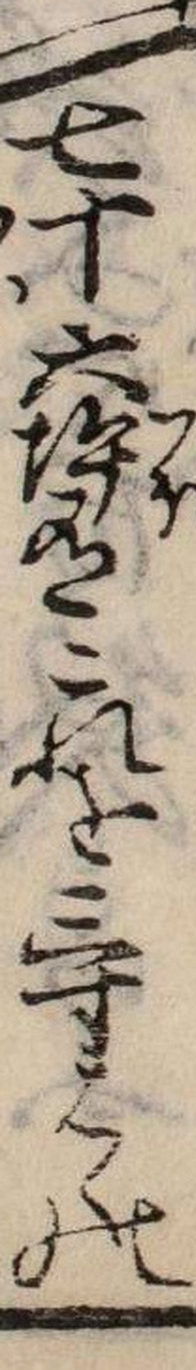七十六坪有これを三寸はくの
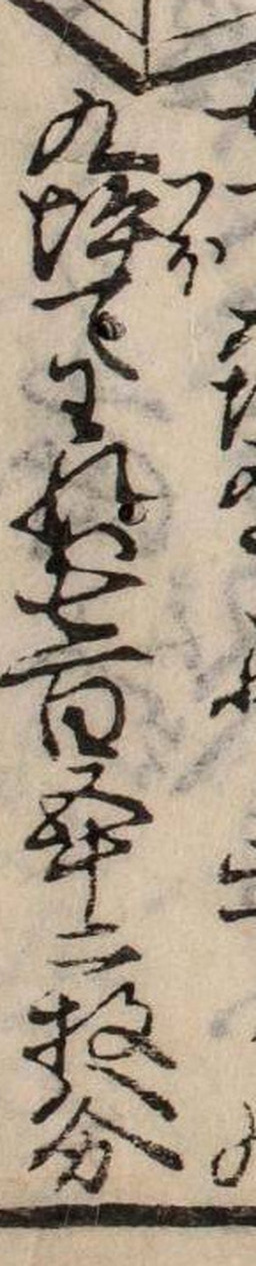九坪てわれは七百五十二枚八分

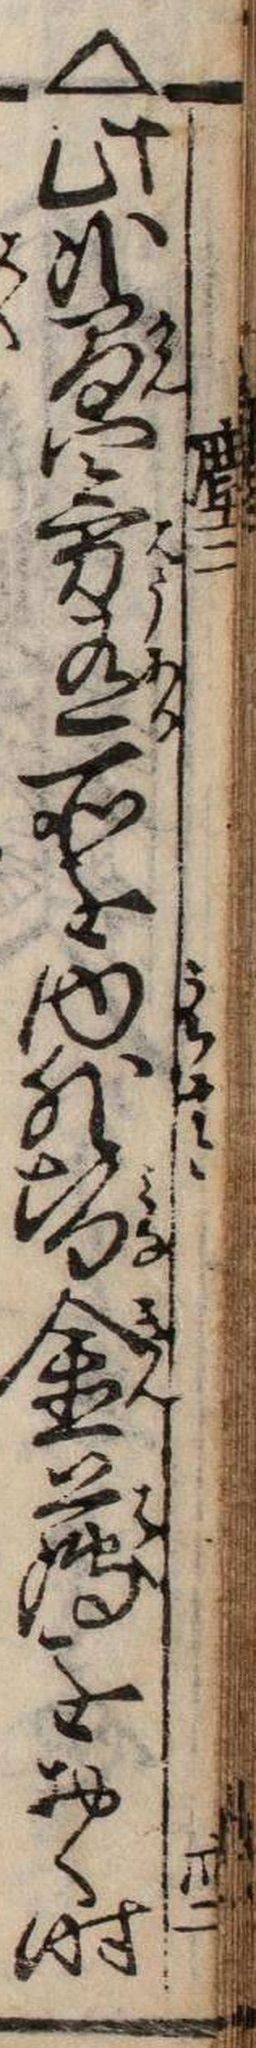△此弐間四方有所を内外皆金薄をおく時
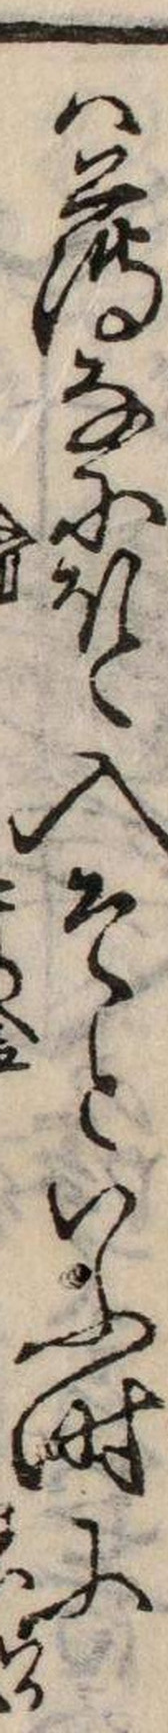は薄なにほと入そといふ時に
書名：塵劫記（寛永11年自跋、京都府立京都学・歴彩館追貴8）
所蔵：京都府立京都学・歴彩館 国文学研究資料館
